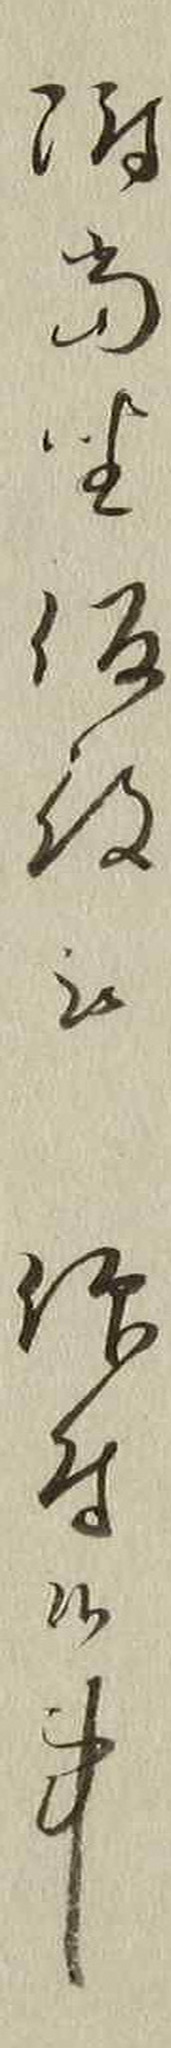附当坐仮役被仰付候事
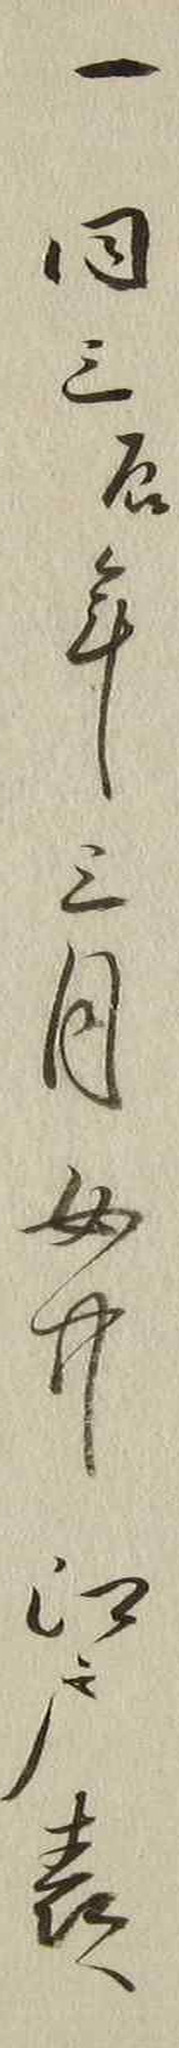一同三辰年三月女中江戸表へ
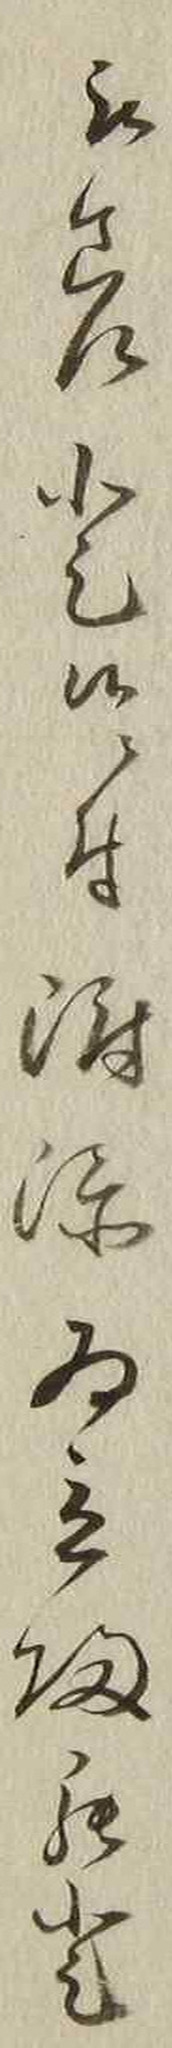被差登候ニ付附添為立帰罷登
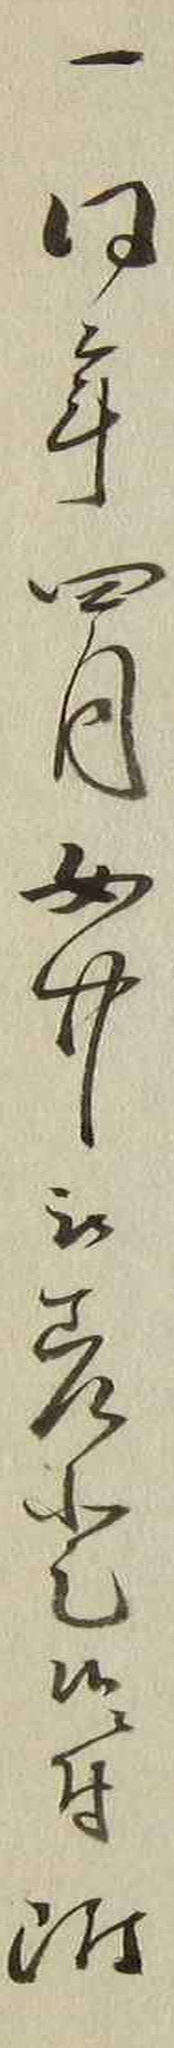一同年四月女中被差登候ニ付附
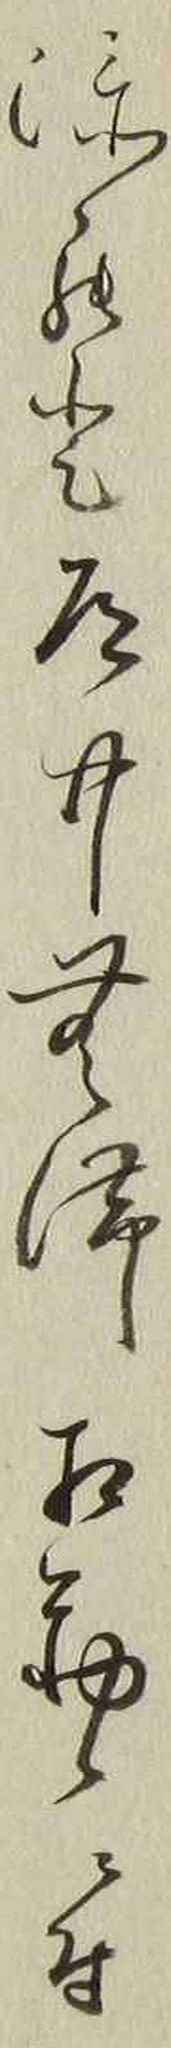添罷登道中無滞相勤候ニ付
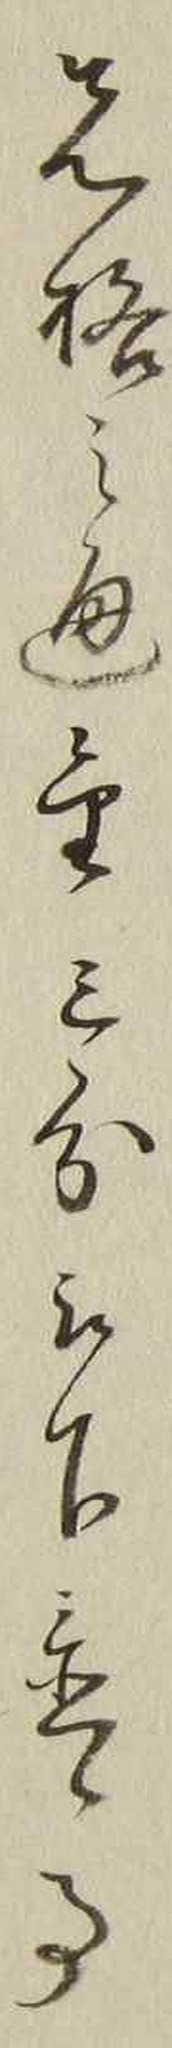先格之通金三分被下置候事
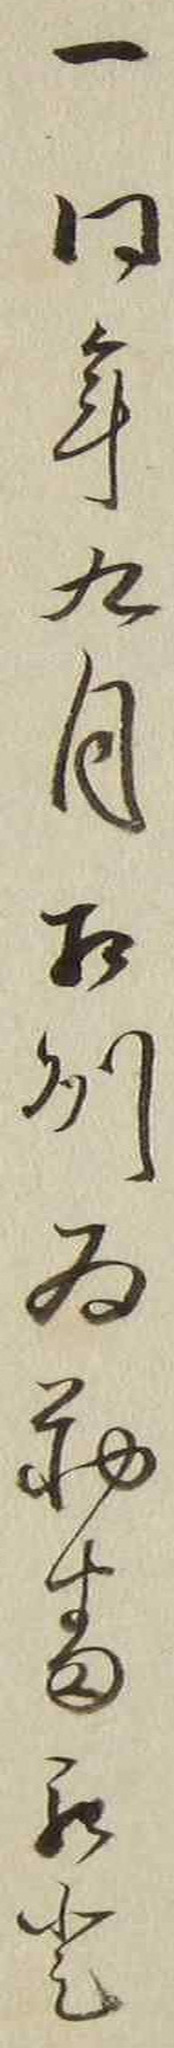一同年九月相州為勤番罷登
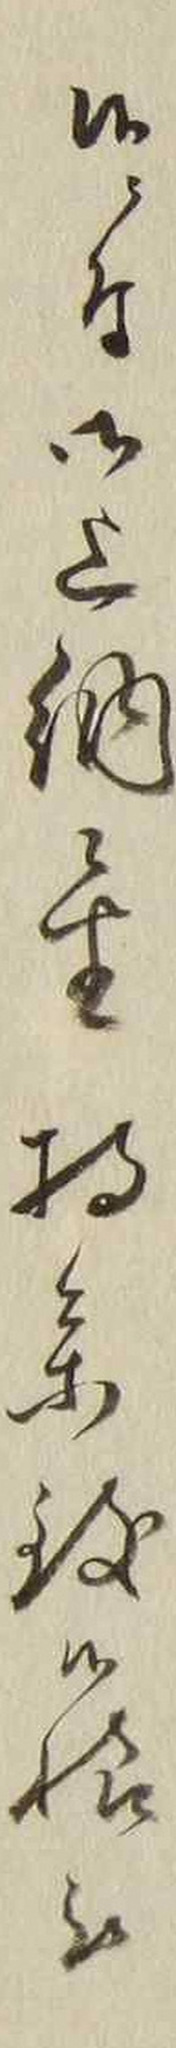候ニ付御上納金持参致候様被

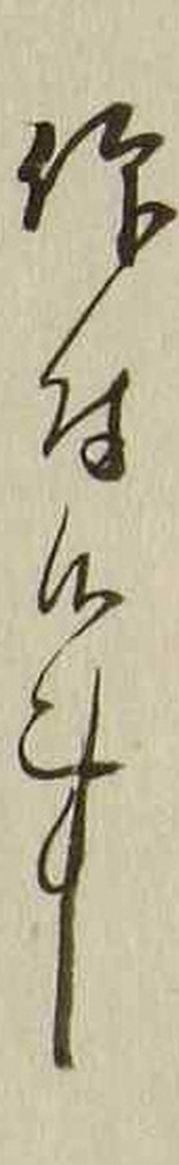仰付候事
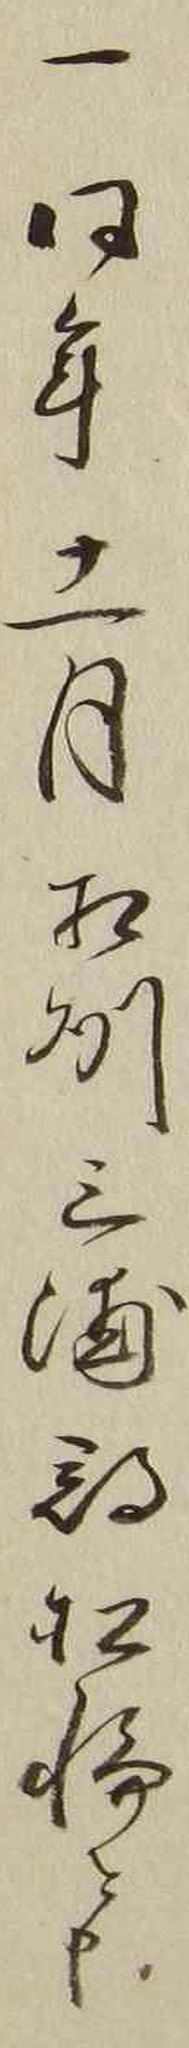一同年十一月相州三浦郡松輪と申
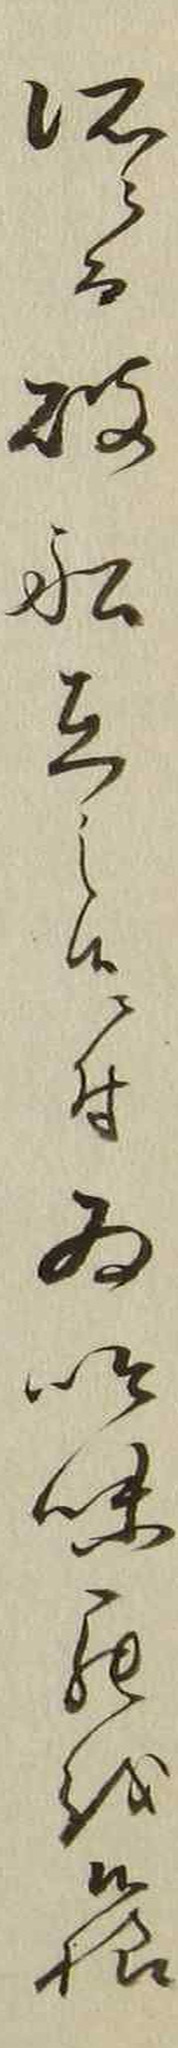所ニ而破船在之候ニ付為吟味罷越候様
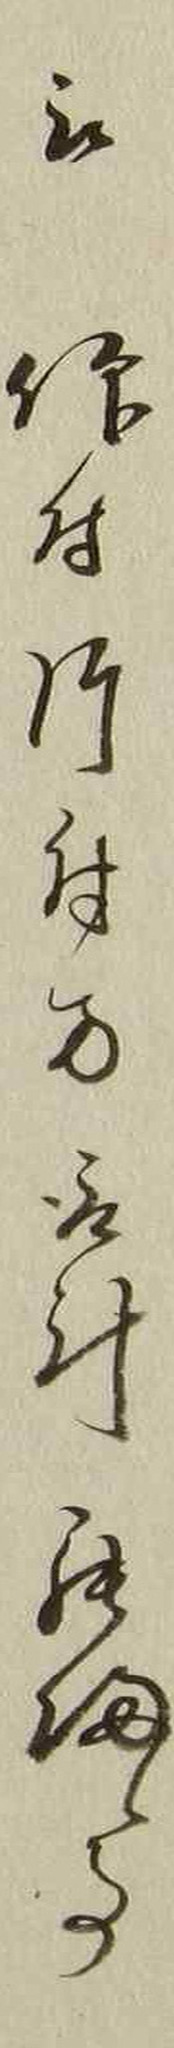被仰付片付方取計罷帰候事
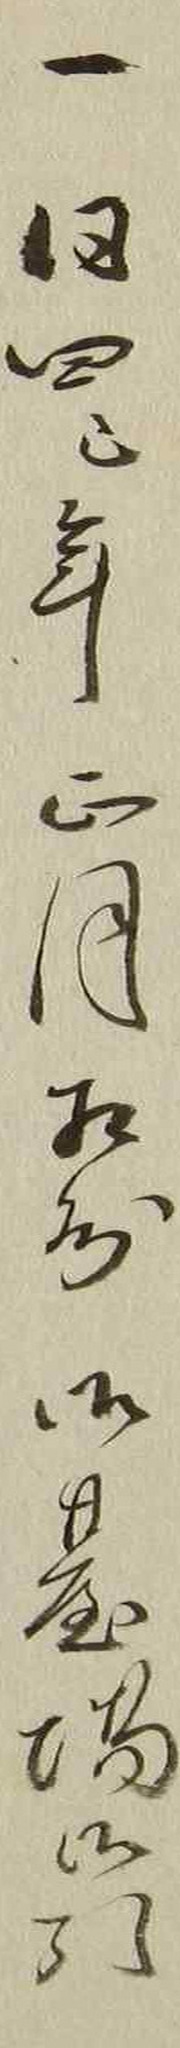一同四巳年正月相州御台場御引
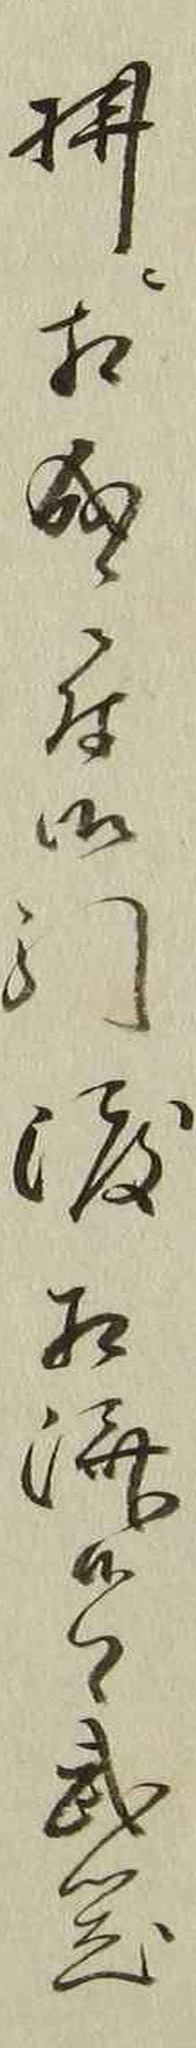払ニ相成候ニ付御引渡相済候ハヽ武器
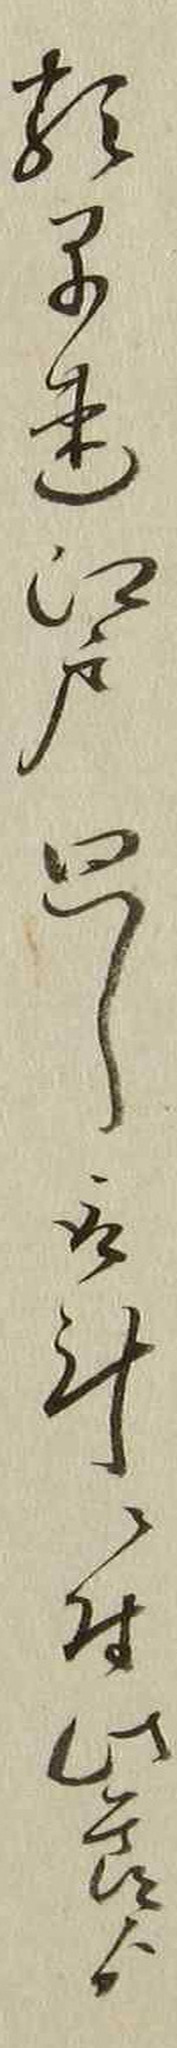類早速江戸廻し取計ニ付此節ゟ
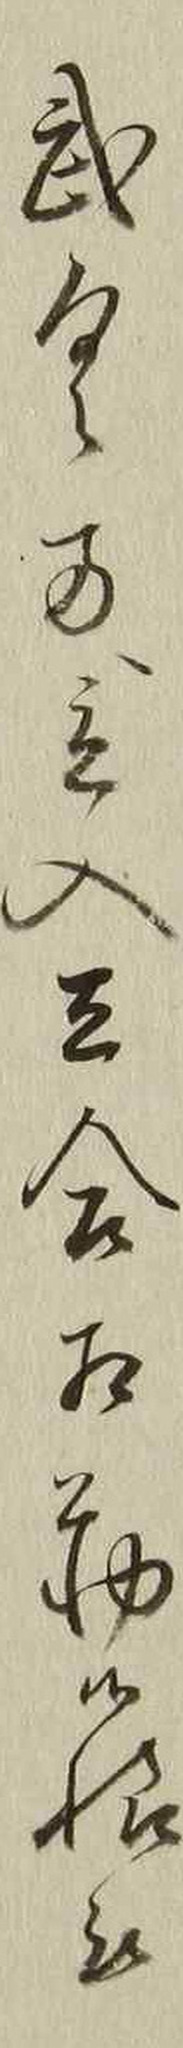武具方へ立入立合相勤候様被
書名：諸士系譜　巻之52　に之部3
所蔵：会津若松市立会津図書館
